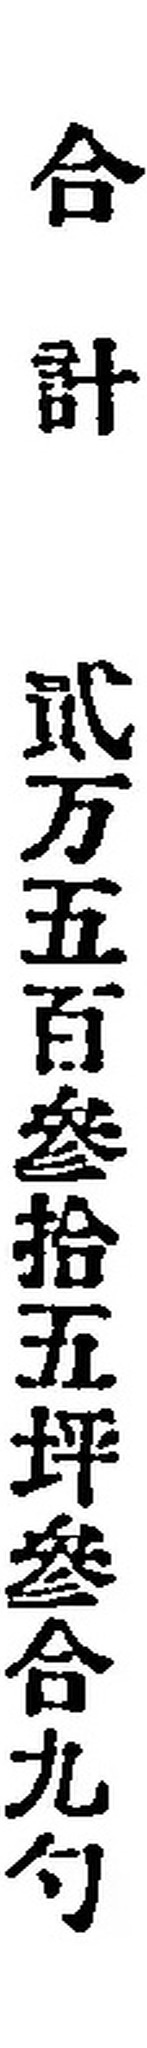合計貳万五百參拾五坪參合九勺
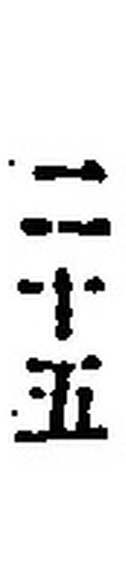二十五

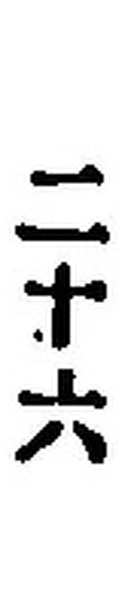二十六
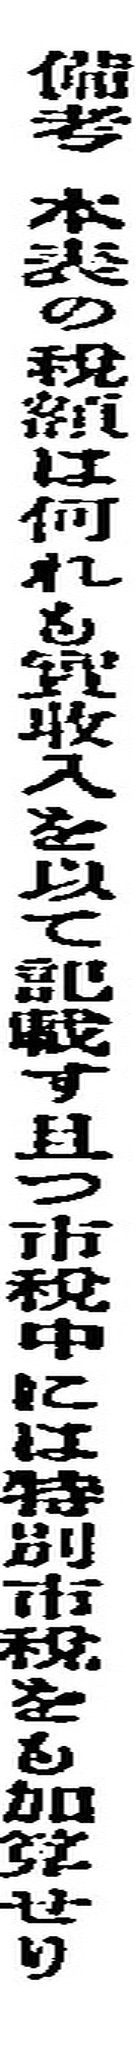備考本表の稅額は何れも實収入を以て記載す且つ市稅中には特別市稅をも加算せり
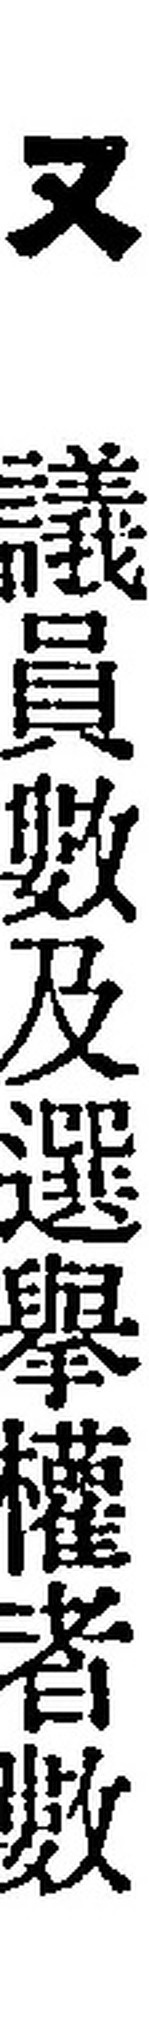ヌ議員數及選擧權者數
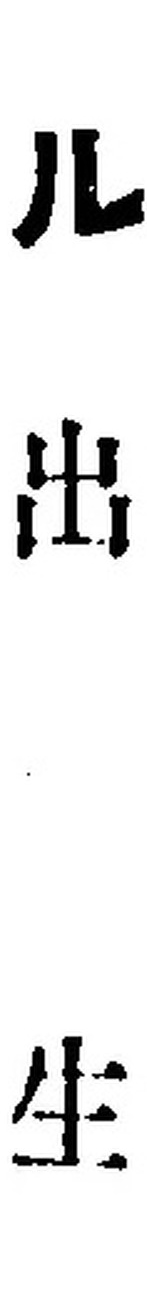ル出生
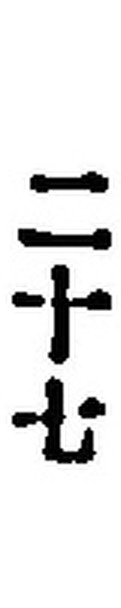二十七

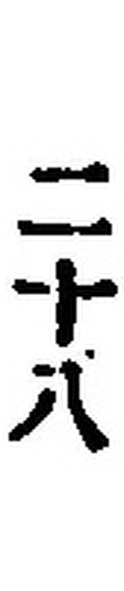二十八
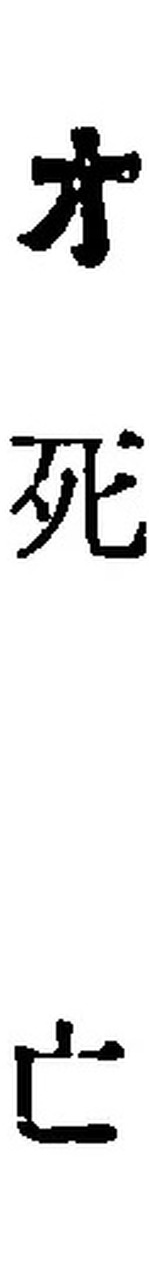オ死亡
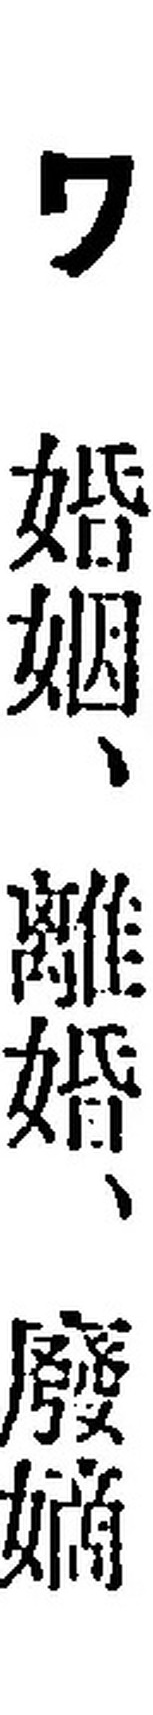ワ婚姻、離婚、廢嫡
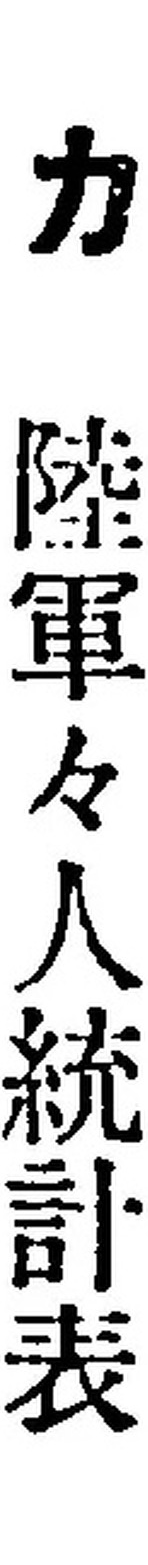カ陸軍々人統計表
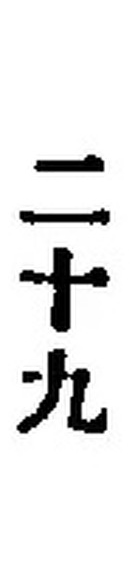二十九

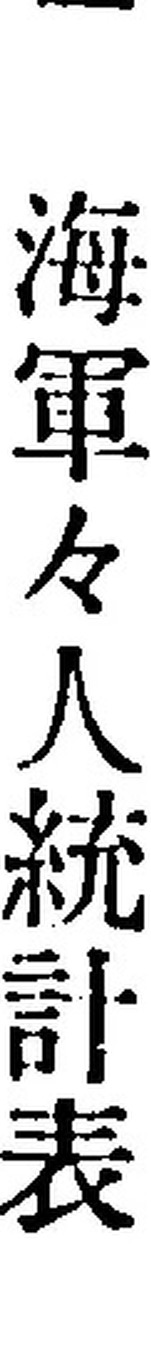ヨ海軍々人統計表
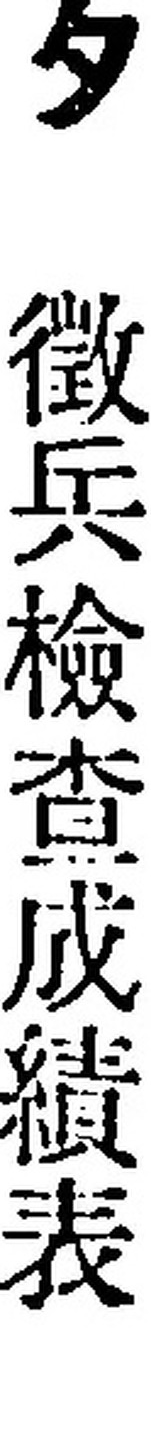タ徴兵檢査成績表
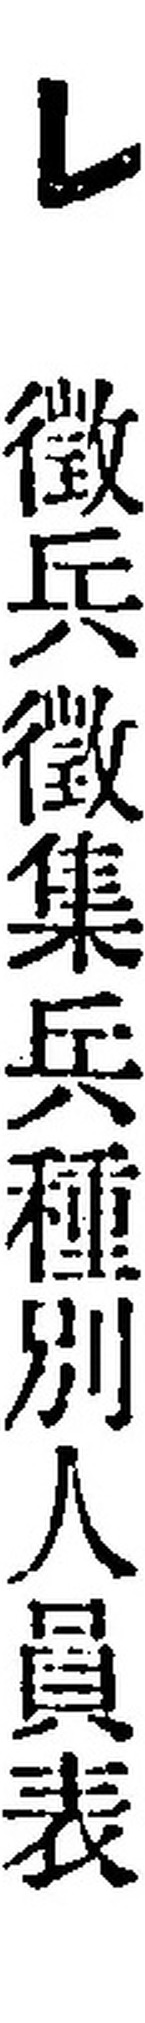レ徴兵徴集兵種別人員表
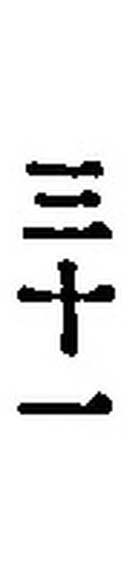三十一
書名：豊橋志要
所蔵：国立国会図書館 National Diet Library, JAPAN
